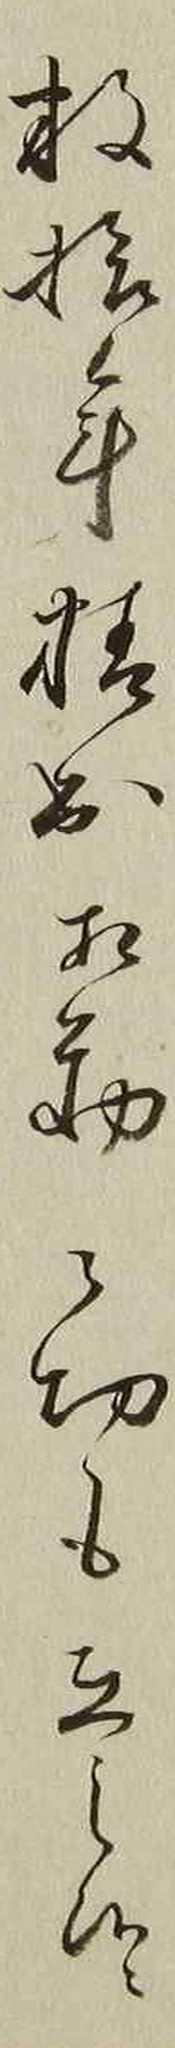数拾年精出相勤ニ功も在之候ニ
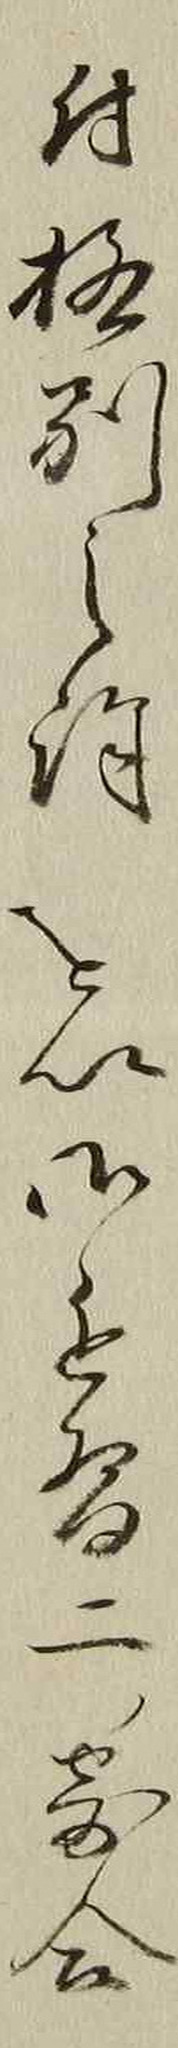付格別之訳を以御近習二ノ寄合
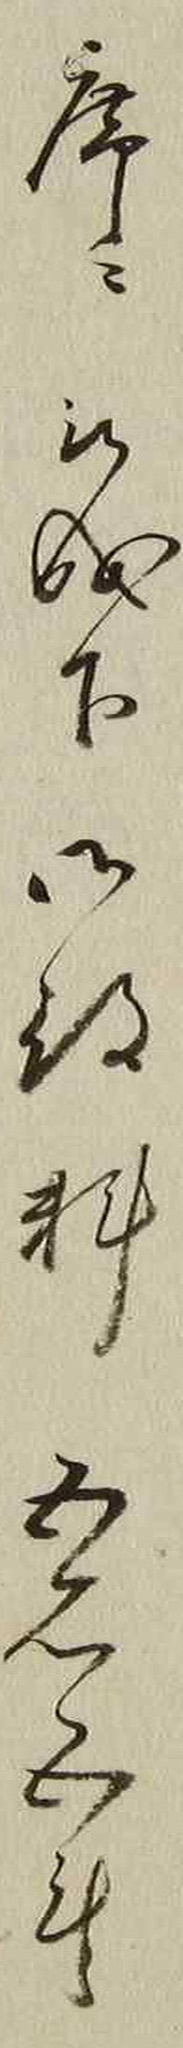席ニ被成下御役料五石五斗
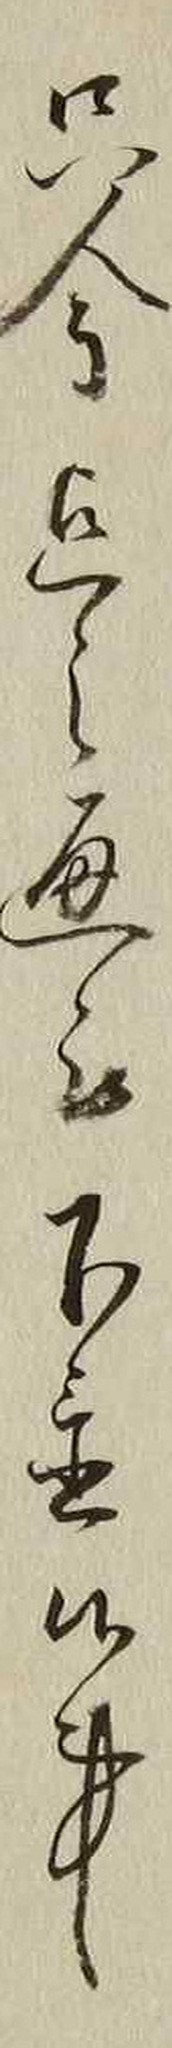只今迄之通被下置候事
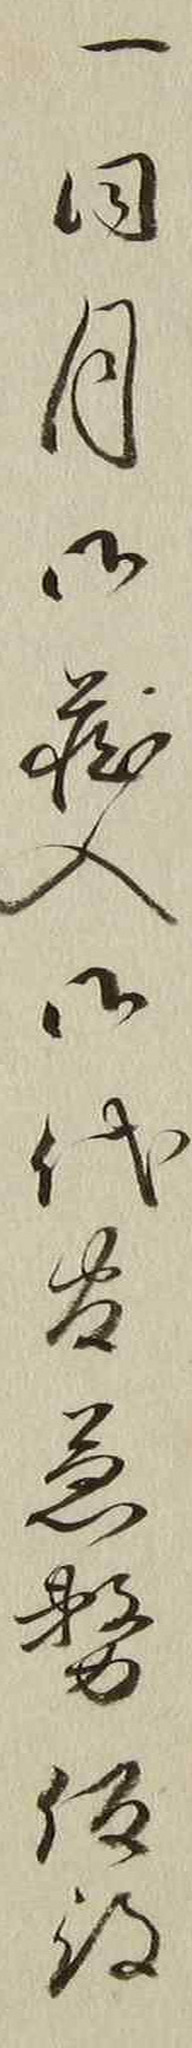一同月御蔵入御代官兼務仮役
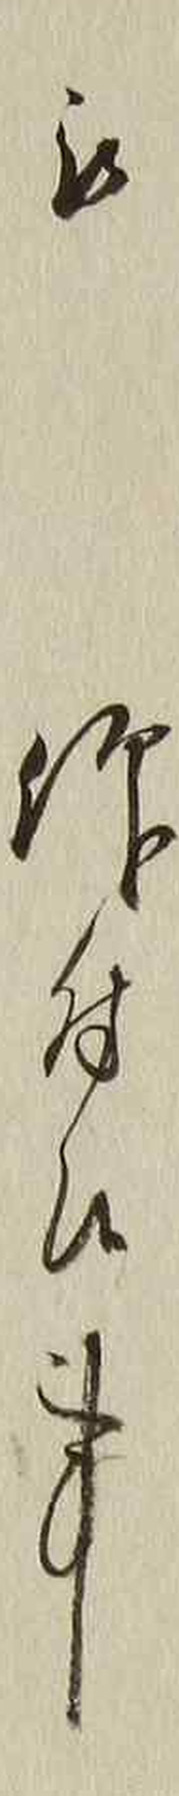被仰付候事
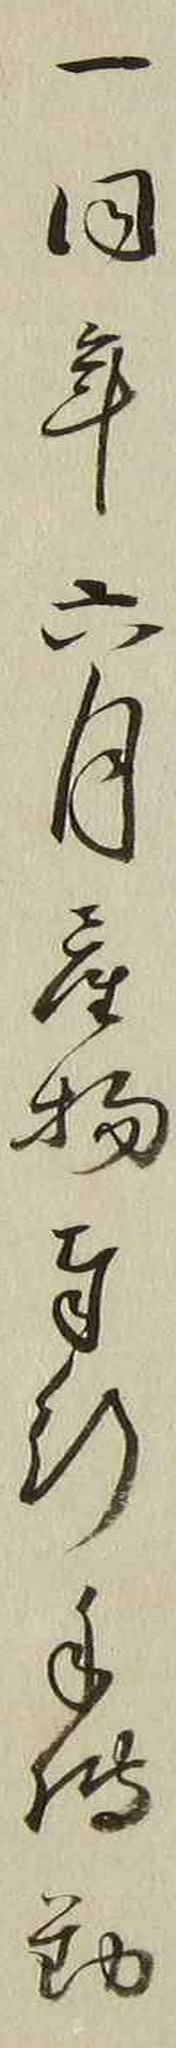一同年六月産物奉行手伝勤
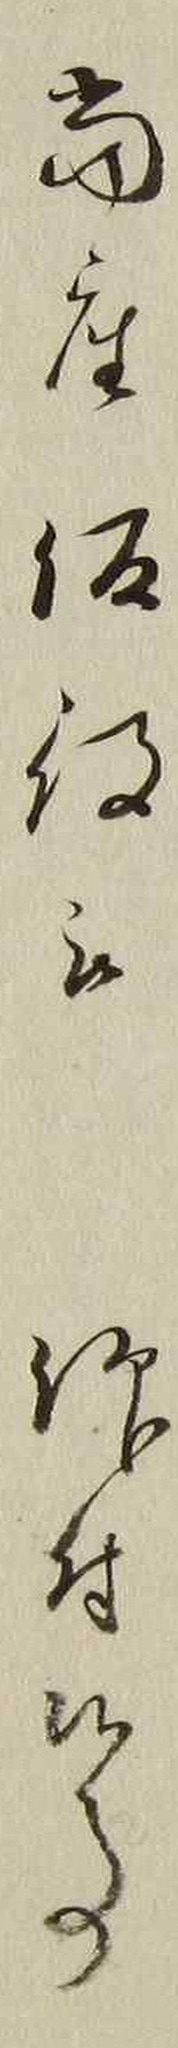当座仮役被仰付候事
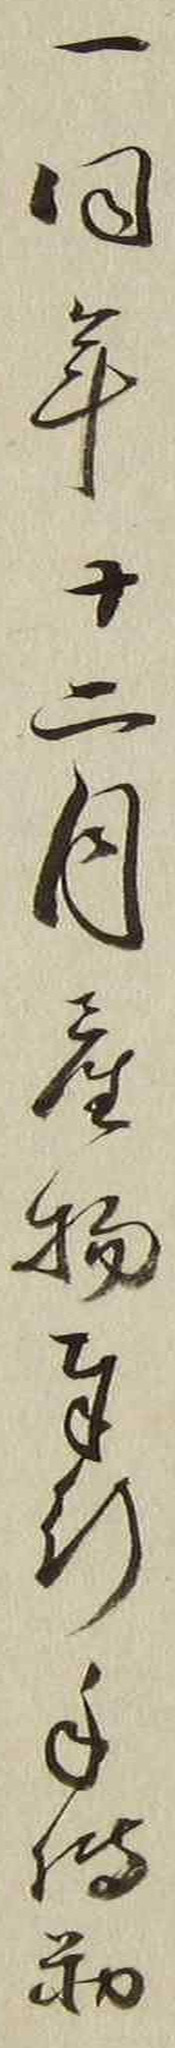一同年十二月産物奉行手伝勤
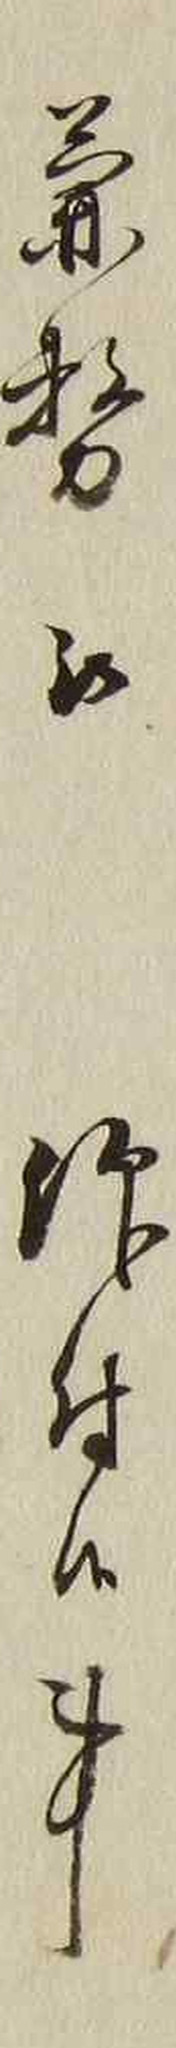兼務被仰付候事
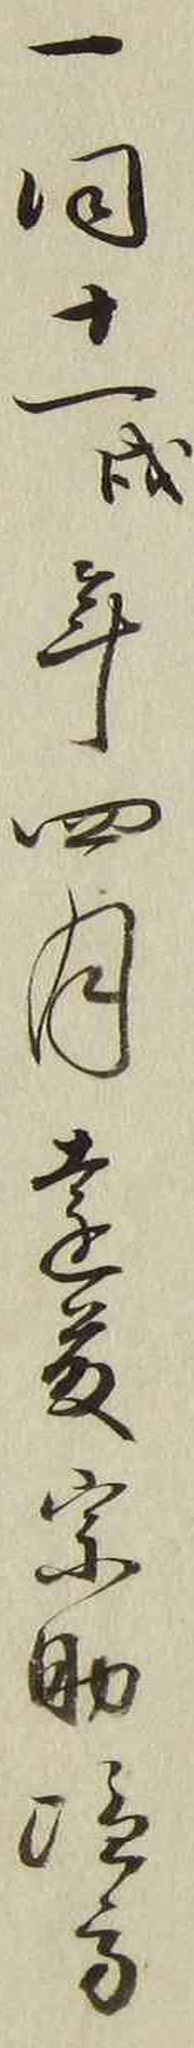一同十一戌年四月遠藤宗助塩方

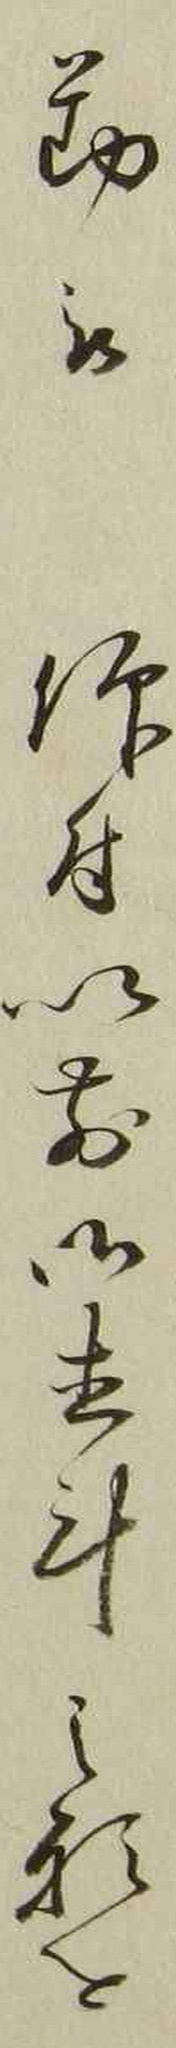勤被仰付以前御生計之形を
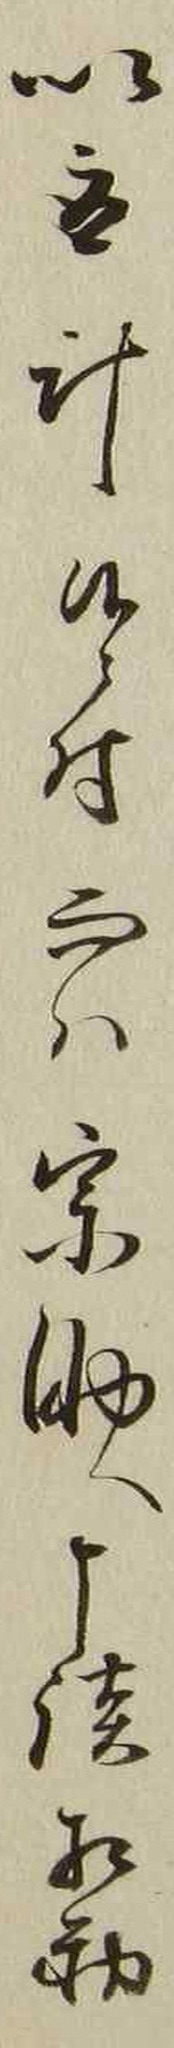以取計候ニ付而ハ宗助へ申談相勤
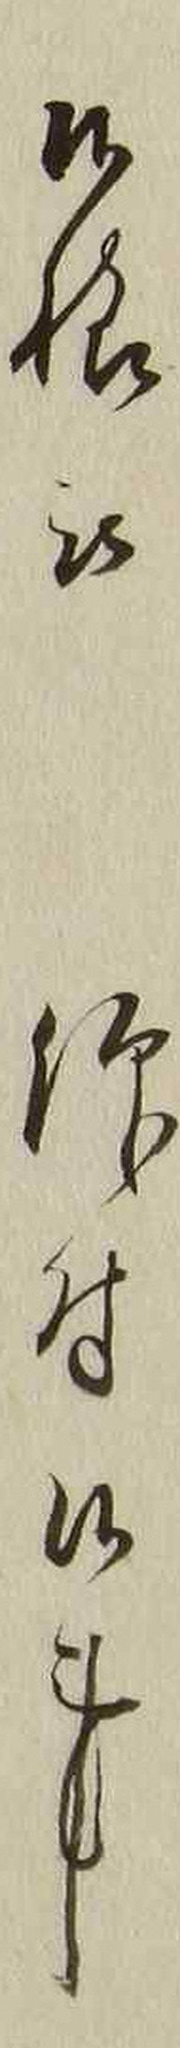候様被仰付候事
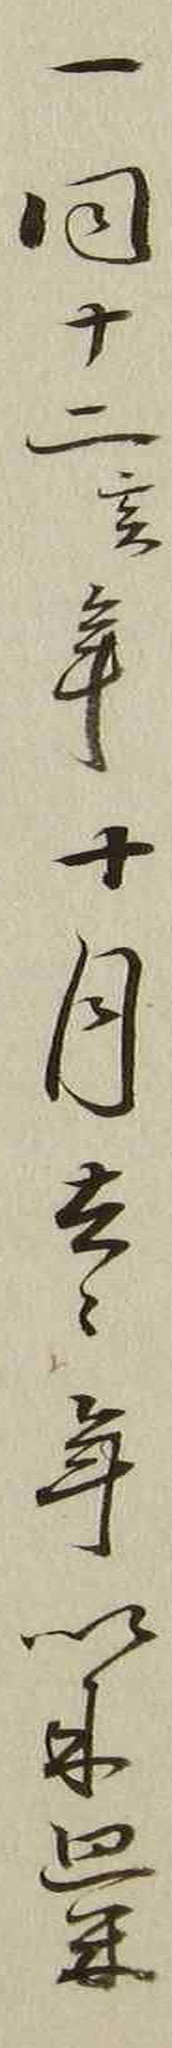一同十二亥年十月去々年以来廻米
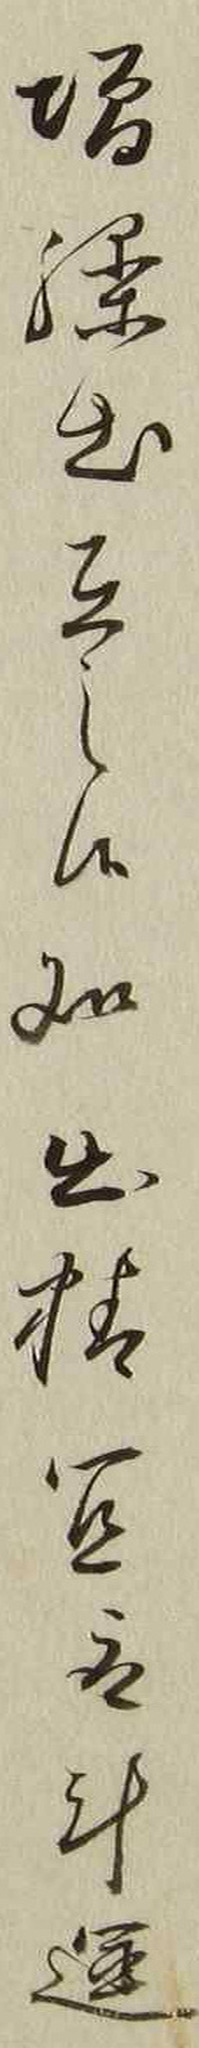増繰出在之候処出精宜取計運
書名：諸士系譜　巻之52　に之部3
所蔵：会津若松市立会津図書館
